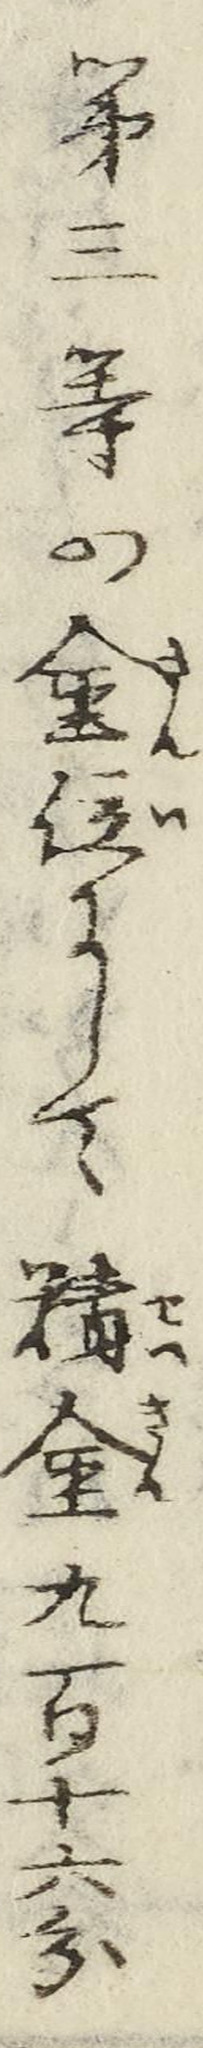第三等の金位にして精金九百十六分
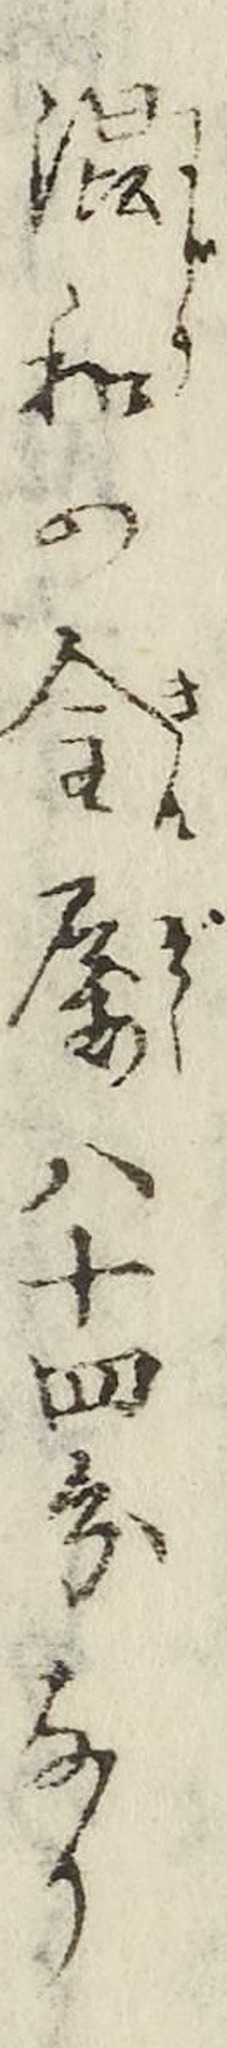混和の金属八十四分なり
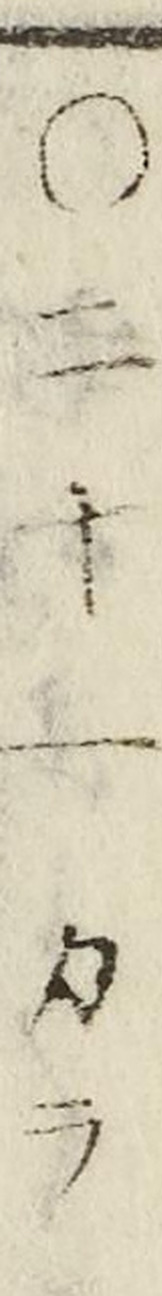○二十一カラ
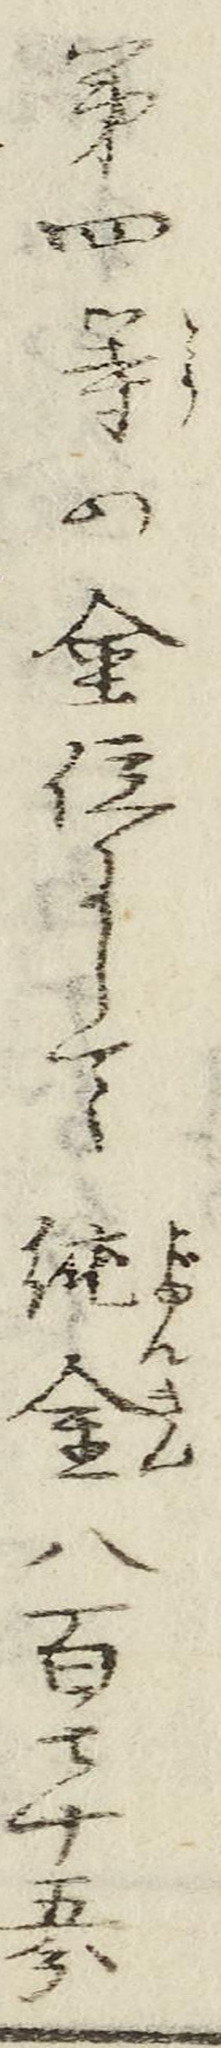第四等の金位にして純金八百七十五分
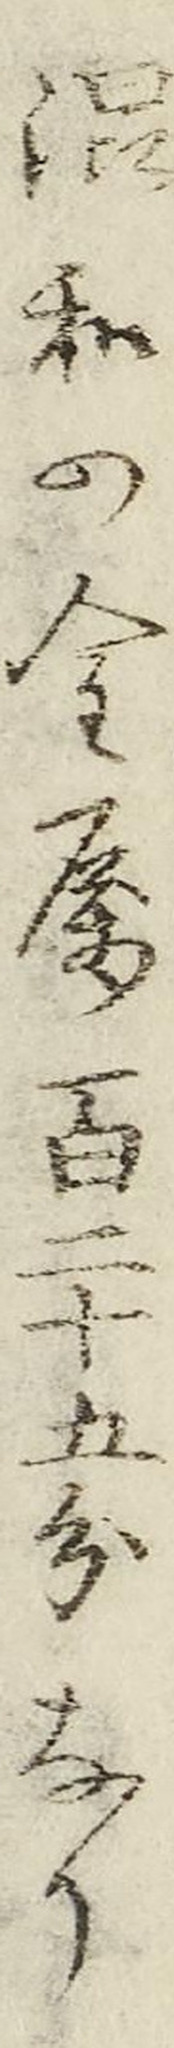混和の金属百二十五分なり
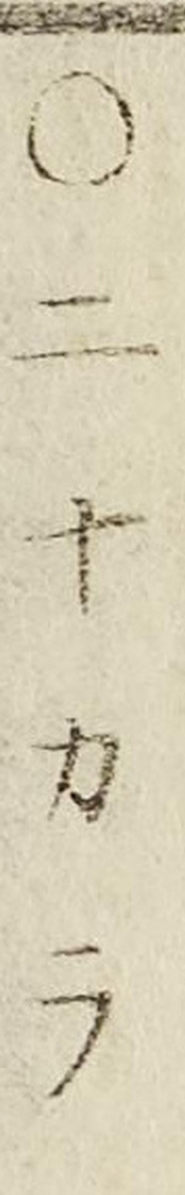○二十カラ
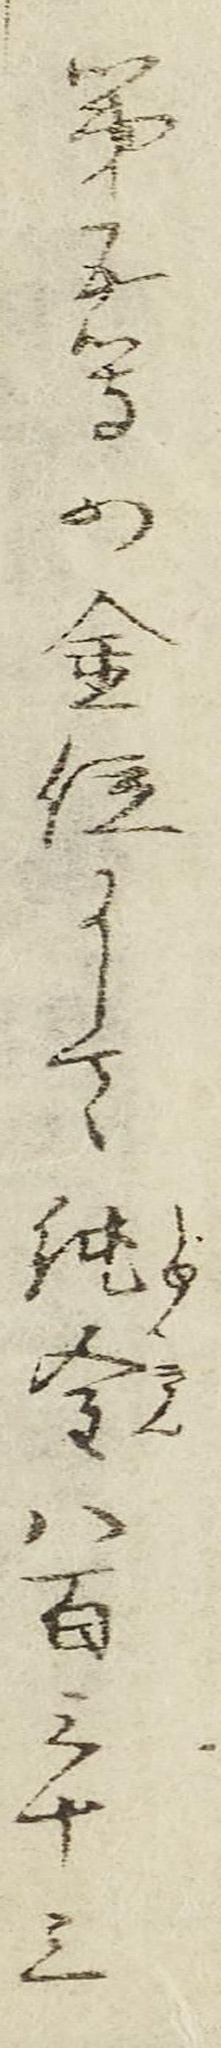第五等の金位にして純金は八百三十三

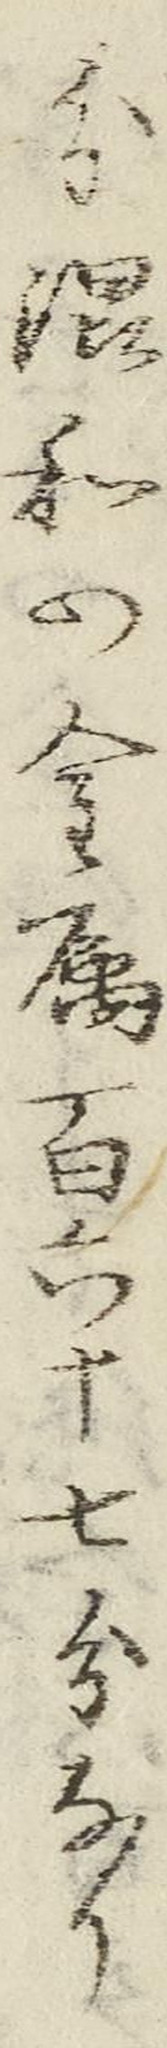分混和の金属百六十七分なり
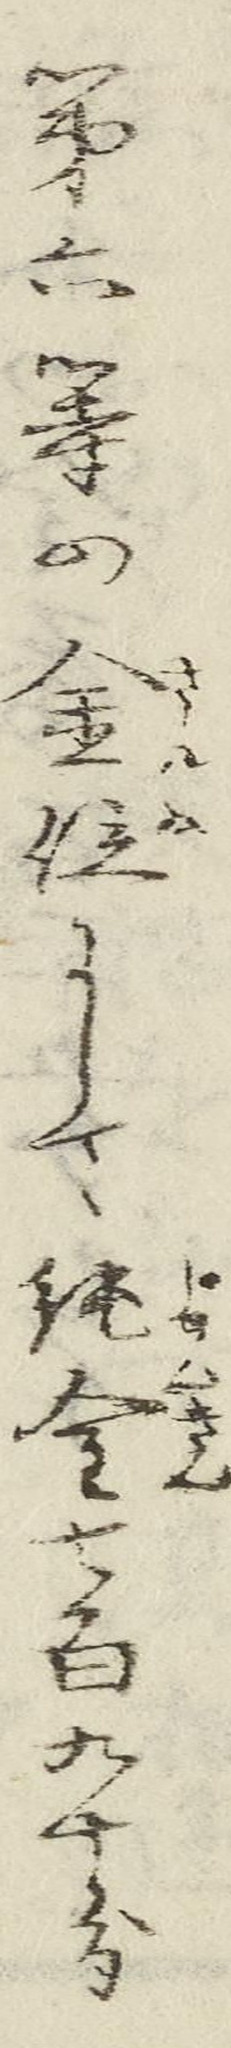第六等の金位にして純金七百九十分
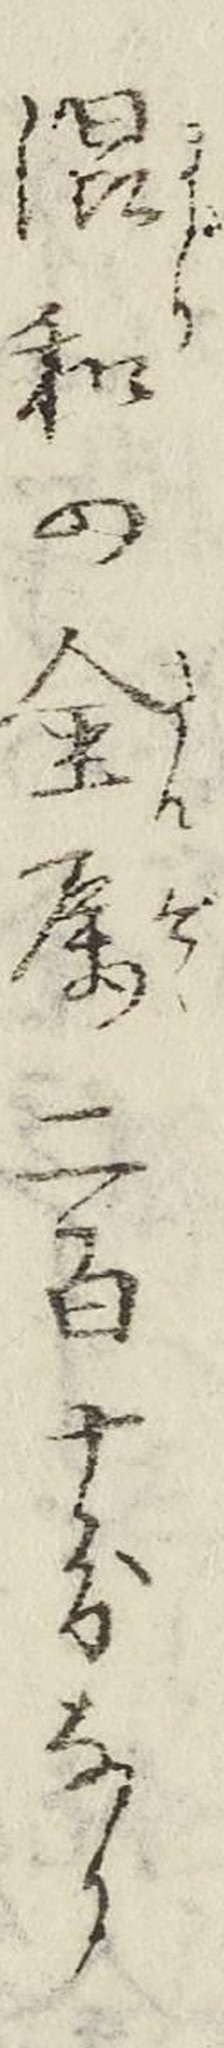混和の金属二百十分なり
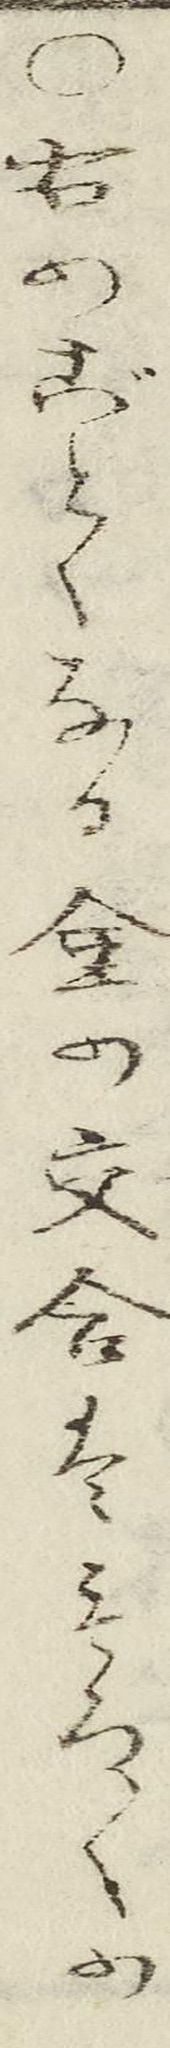○右のごとくなる金の交合はもろ〳〵の
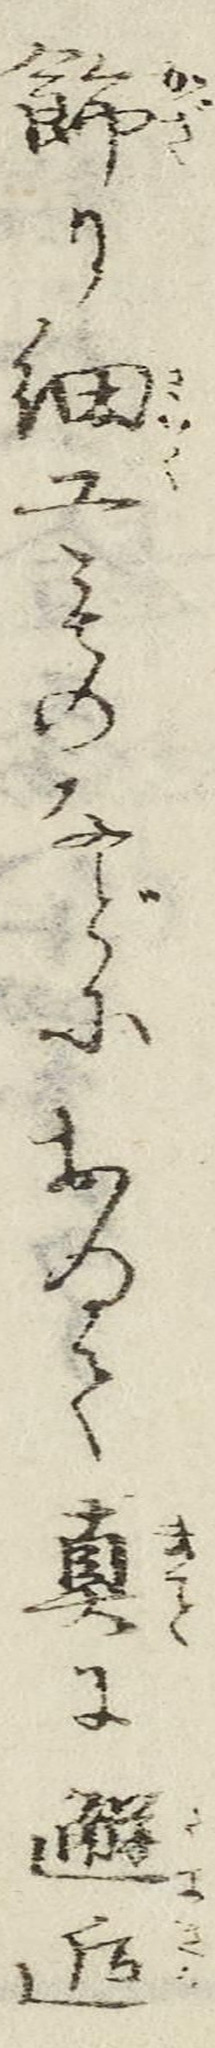飾り細工ものなどにおゐて真に邂逅
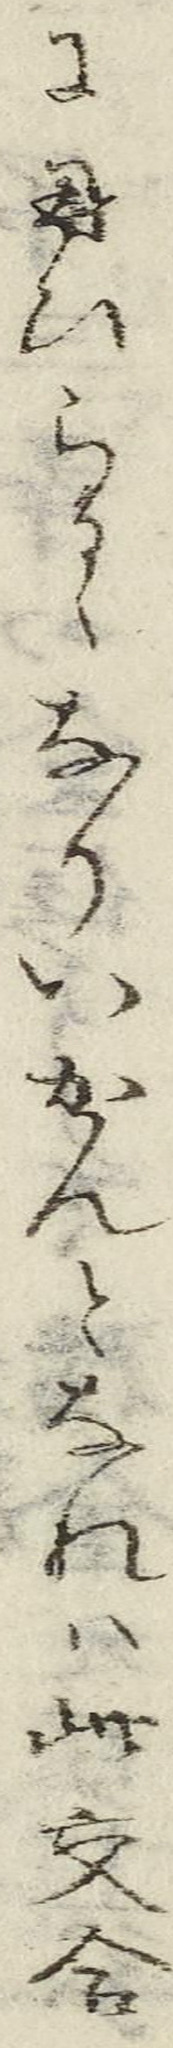に用ひらるゝなりいかんとなれは此交合
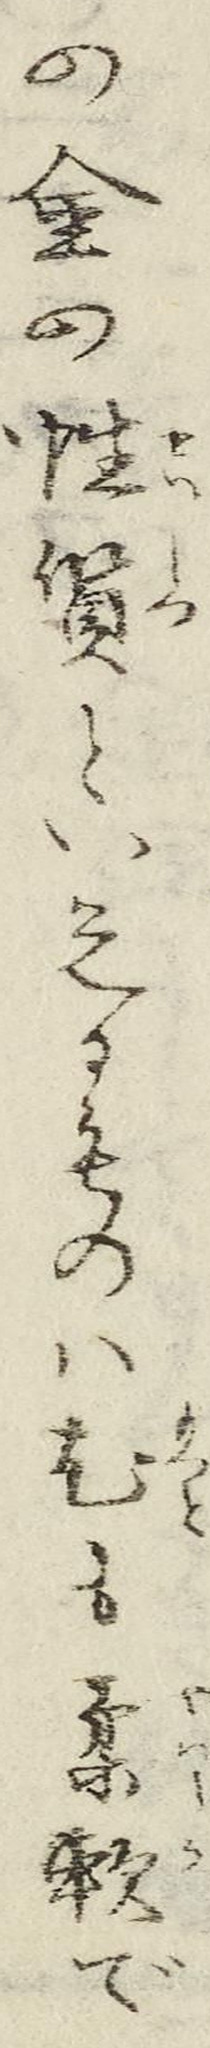の金の性質といえるものは尤も柔軟で
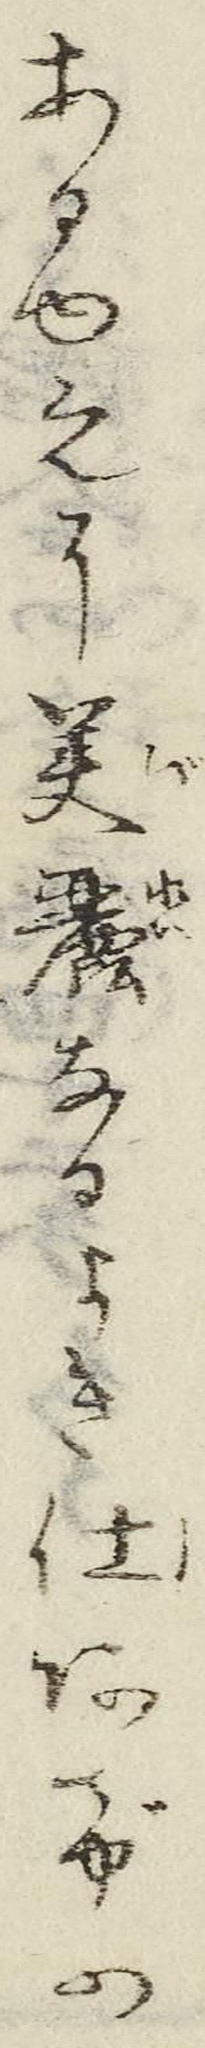あるゆえに美麗なるよき仕あげの
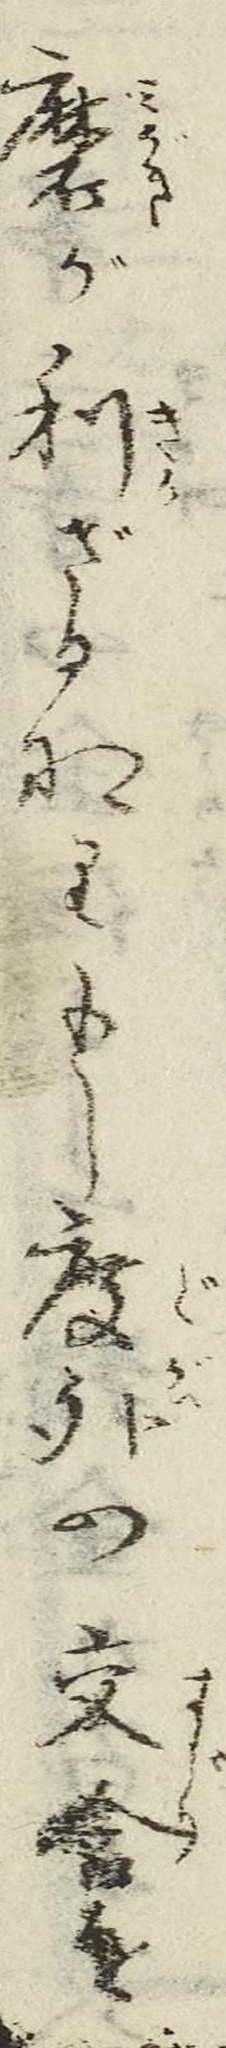磨が利ざるなりもし度外の交合を
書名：[時計に関する冊子]
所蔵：東京大学地震研究所図書室 Earthquake Research Institute Library, The University of Tokyo, JAPAN
